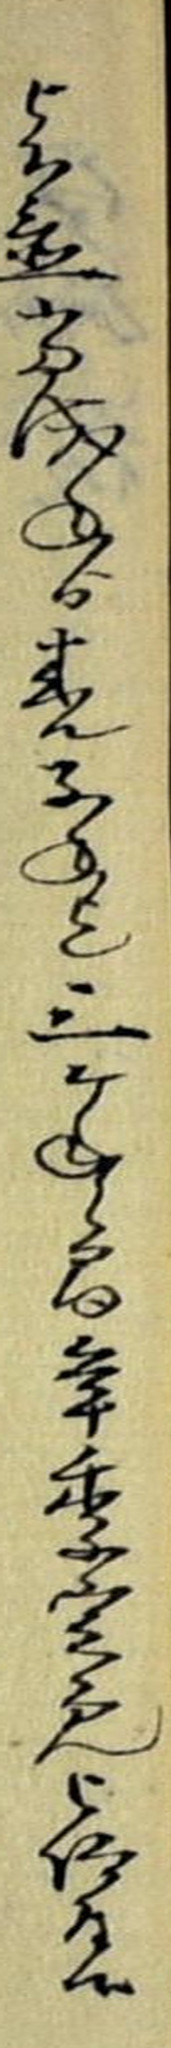被下置当戌年ゟ来ル子年迄三ケ年之間年季定免被仰付候
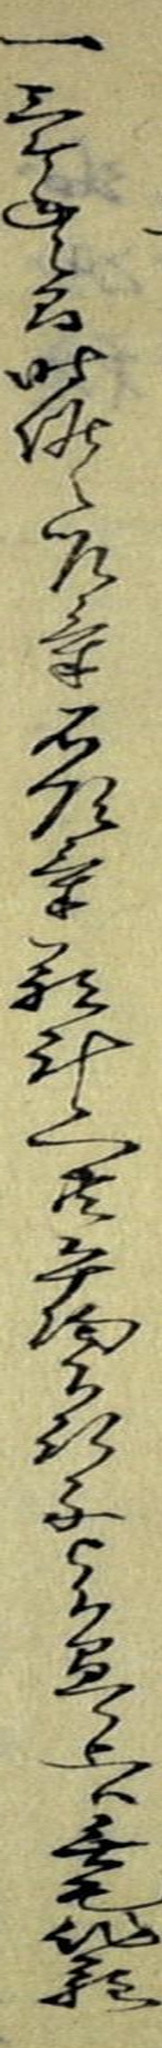一三ケ年之間時候之順気不順気難計候へ共平均下行米被下置候上ハ無毛作難
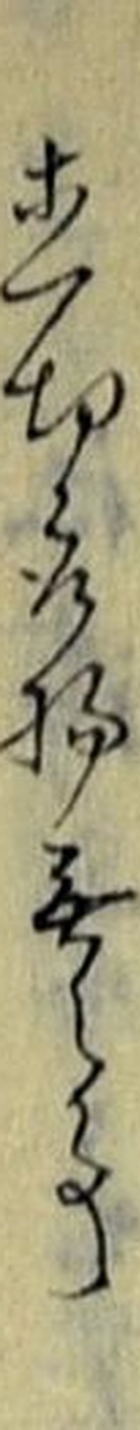等一切取揚無之事
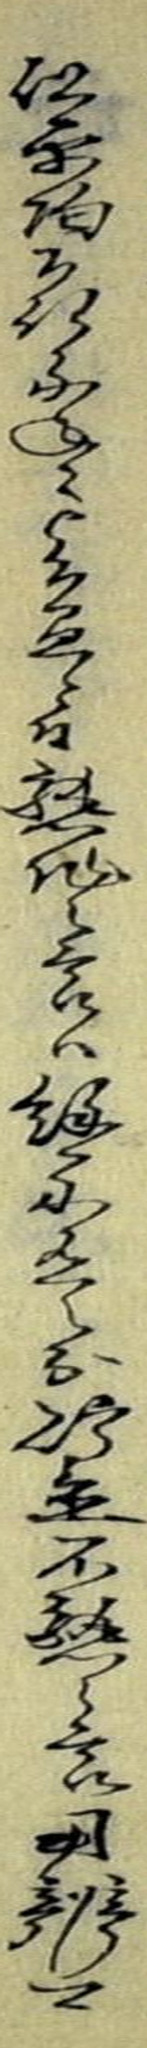但平均下行米年々被下置ニ付熟作之節ハ余米有之分貯置不熟之節用弁可
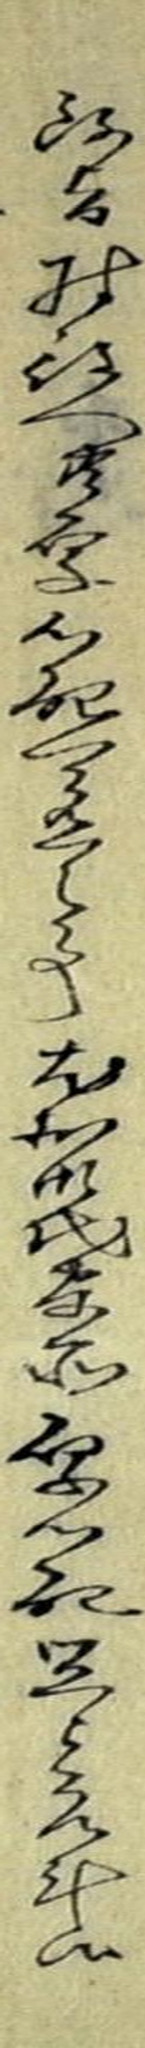致旨村役人共厚心配可有之事尤於御代官所厚心配宜被取計候
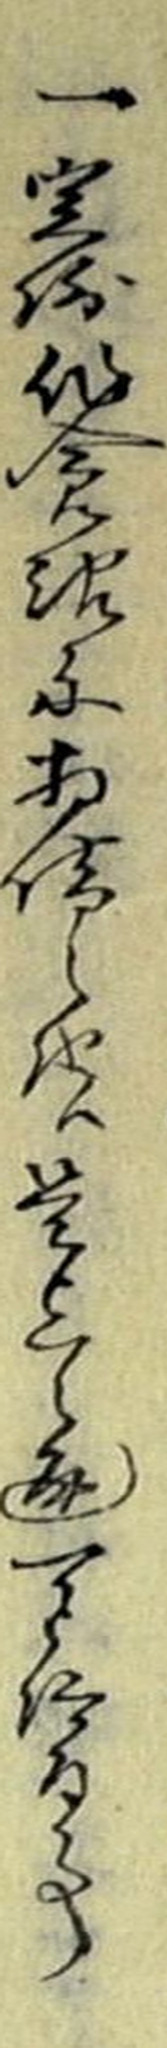一定儀作入節銀米拝借之儀ハ是迄之通可被仰付事
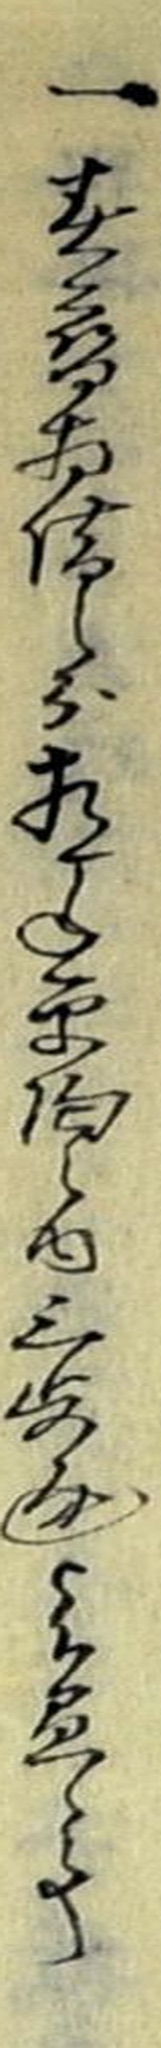一春暮拝借之分拾ケ年平均之内三歩通被下置候事
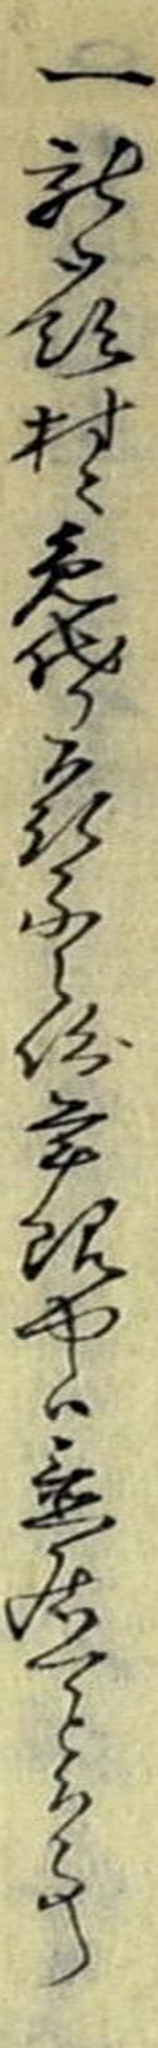一新御領村々免代り下行米之儀年限中ハ置居可被下事
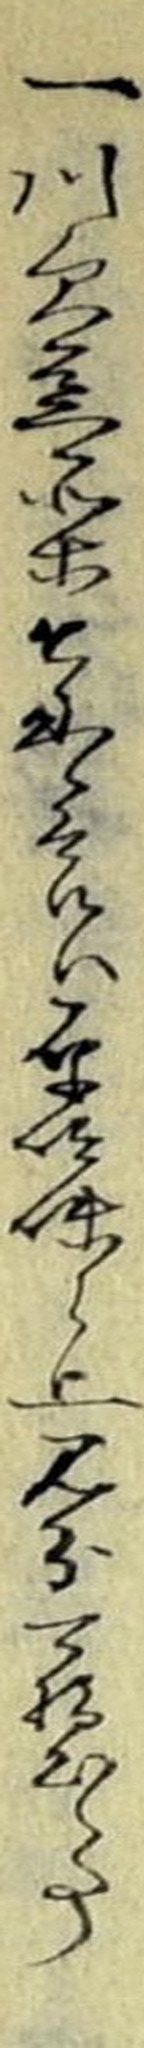一川欠荒所等出来候節ハ厚吟味之上見分可指出事
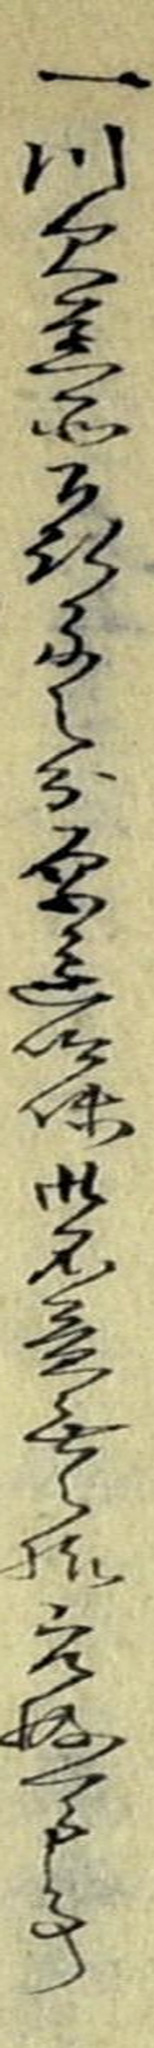一川欠荒所下行米之分厚遂吟味御不益無之様取扱可申事
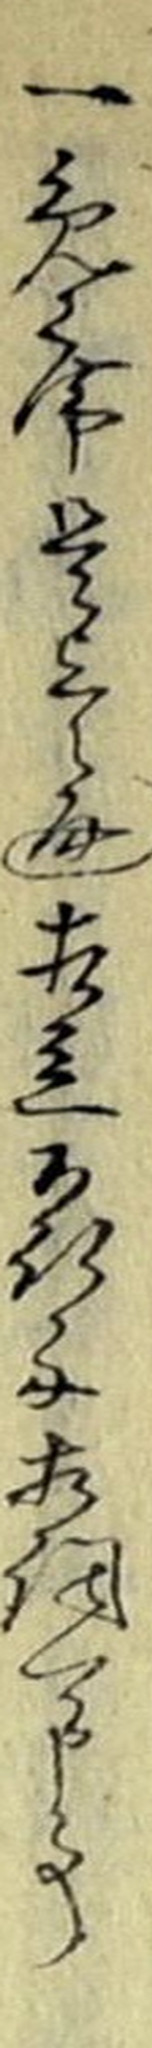一免席是迄通相立下行米相調可申事
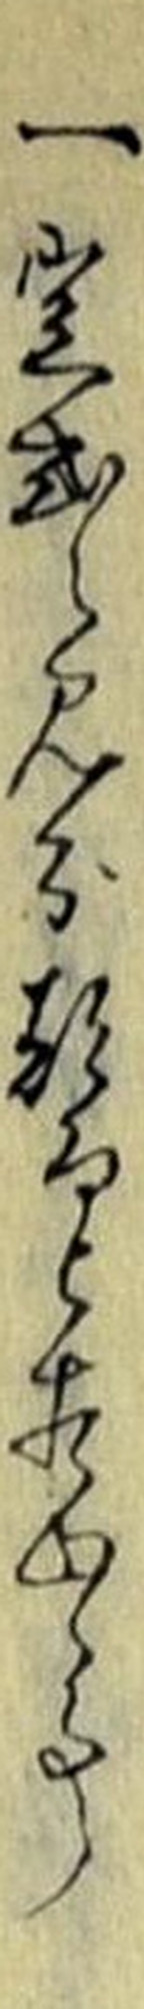一定式之見分都而被相止之事
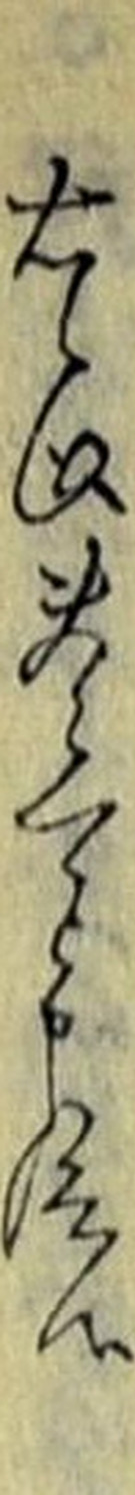右之趣夫々可被申渡候
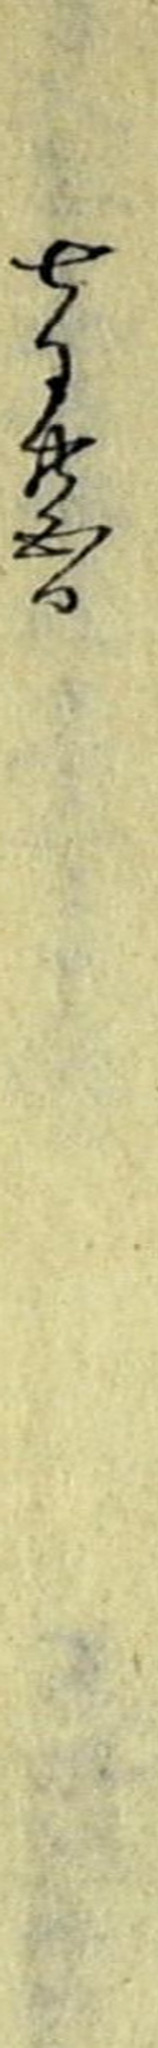七月廿五日
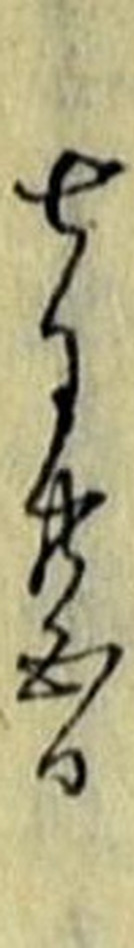七月廿五日
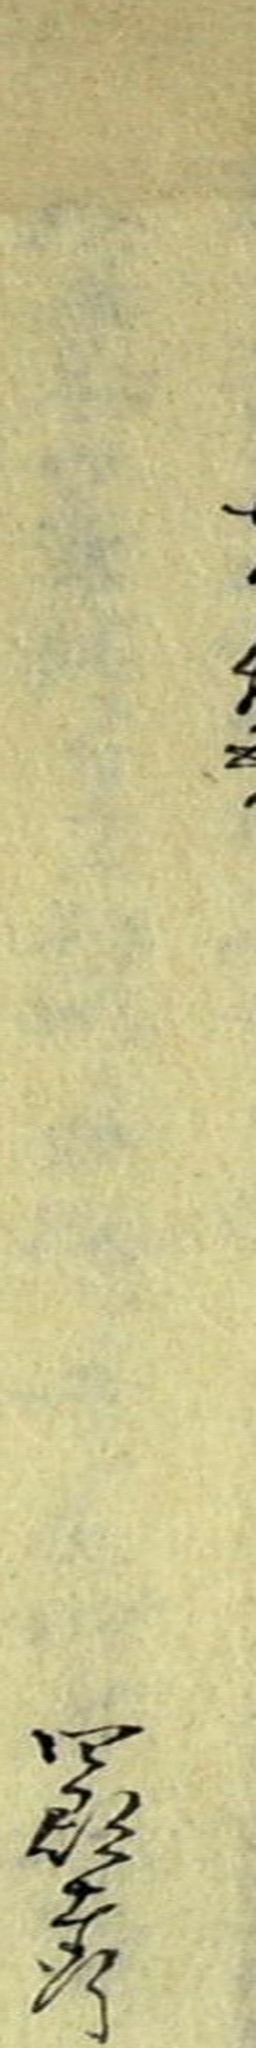四郡奉行
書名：命令之部 五
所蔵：福井県文書館 Fukui Prefectural Archives
